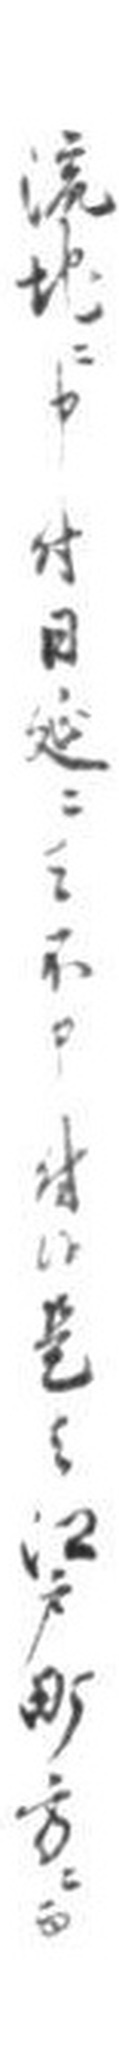流地ニ申付日延ニ者不申付候是者江戸町方ニ而
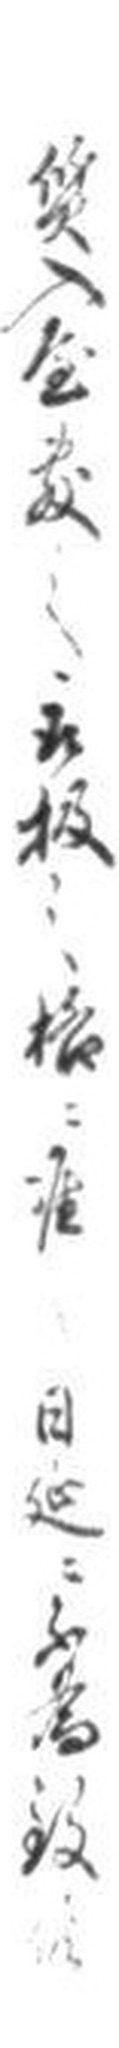質入屋敷之取扱之格ニ准し日延ニ不為致候
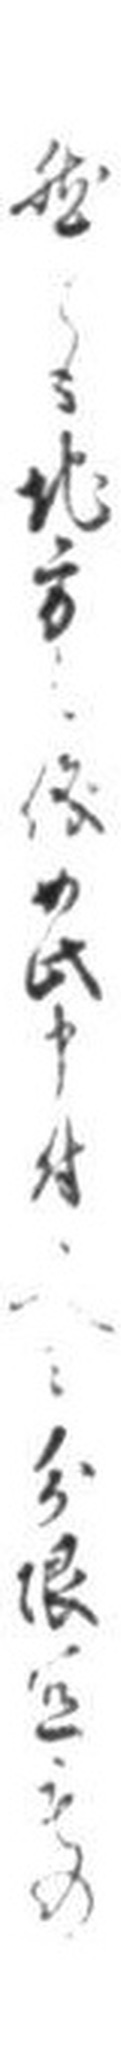然とも地方之儀如此申付候へ者分限宜もの
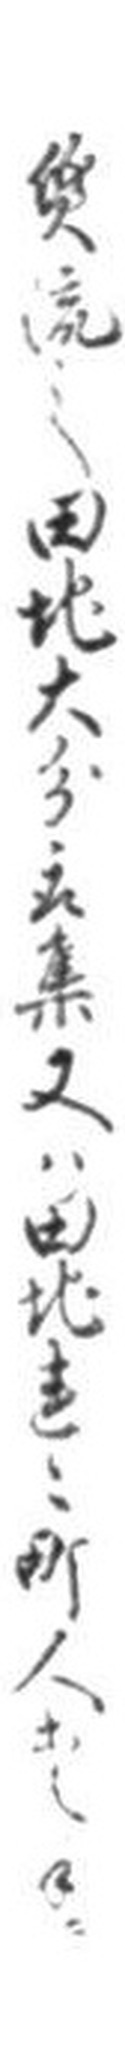質流之田地大分取集又ハ田地連々町人等之手ニ
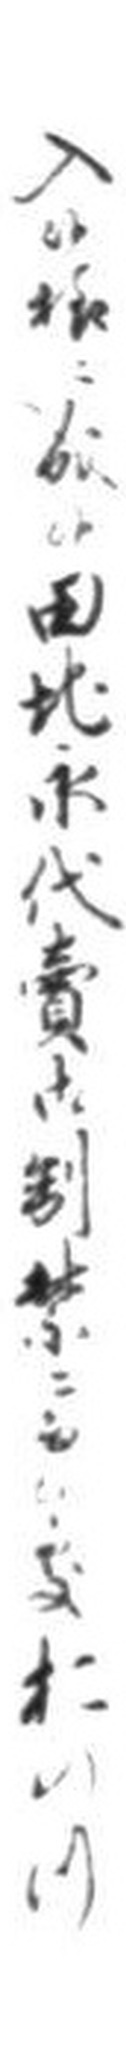入候様ニ成候田地永代売御制禁ニ而候処おのつ
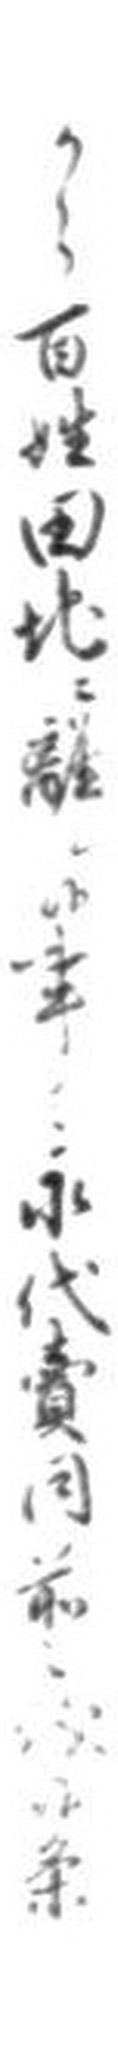から百姓田地ニ離レ候事者永代売同前之儀候条
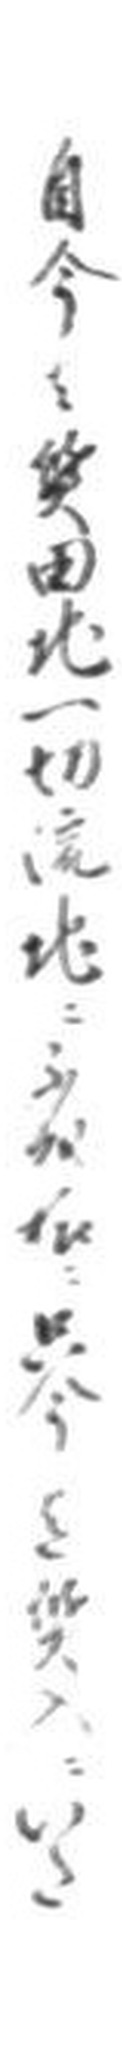自今者質田地一切流地ニ不成様ニ只今迄質入ニいた
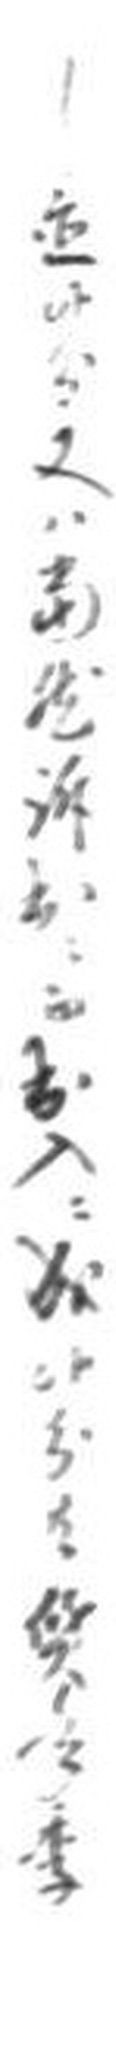し置候分又ハ当然訴出ニ而出入ニ成候分共質年季
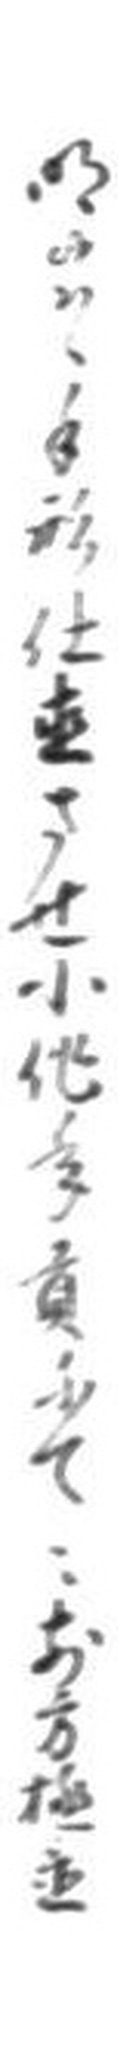明候ハヽ手形仕置させ小作年貢にてと前方極置
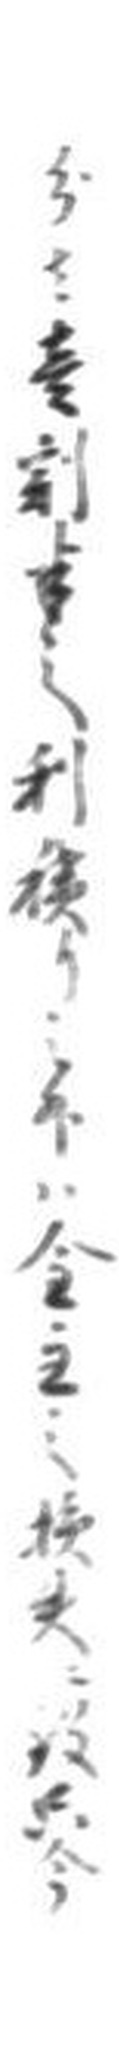分者壱割半之利積り之外ハ金主之損失ニ致只今
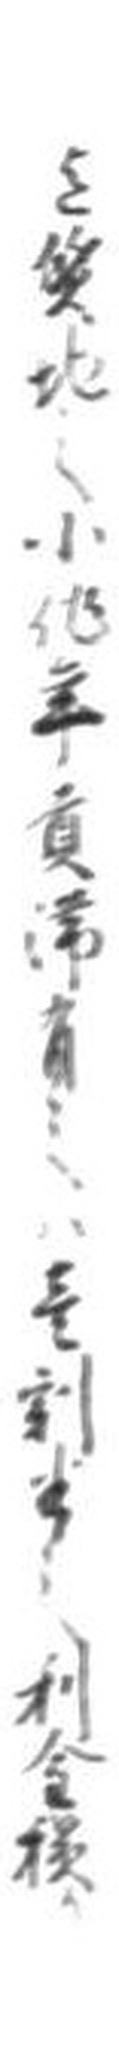迄質地之小作年貢滞有之ハ壱割半之利金積り
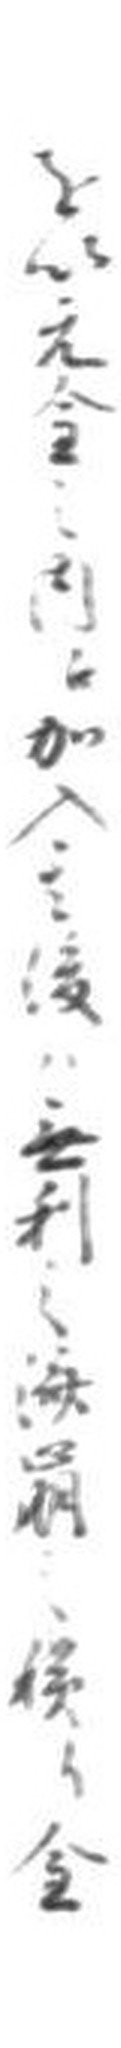を以元金之内江加入其後ハ無利之済崩之積り金
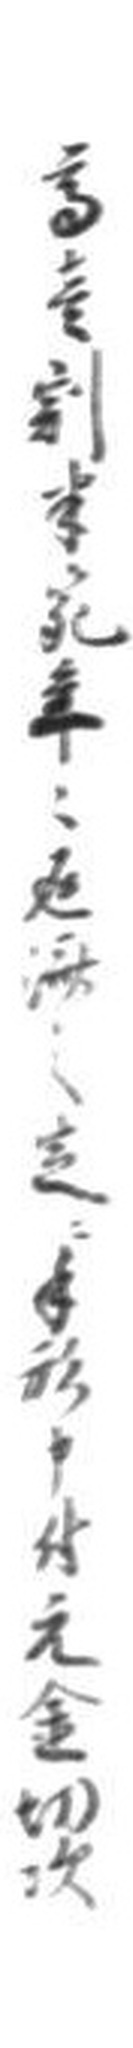高壱割半宛年々返済之定ニ手形申付元金切次
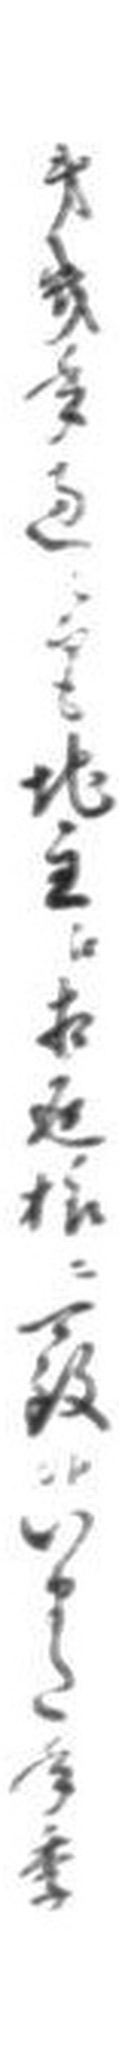第幾年過ニ而も地主江相返様ニ可致候いまた年季
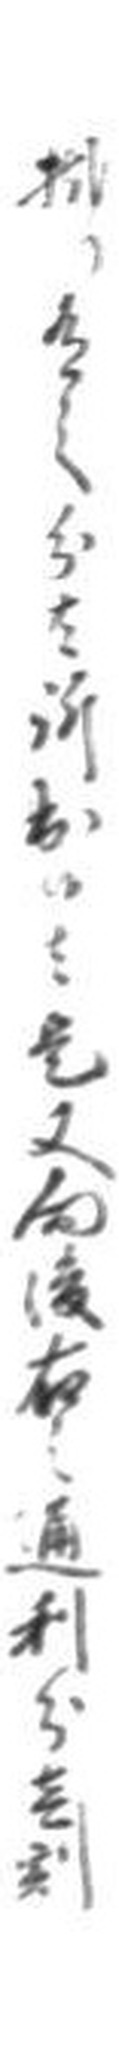掛り有之分共訴出候者是又向後右之通利分壱割

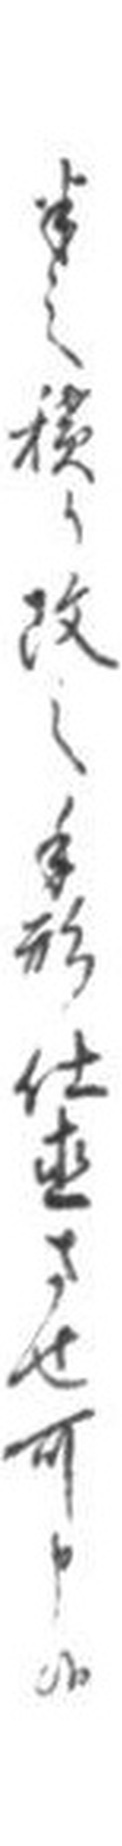半之積り改之手形仕置させ可申候
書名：家譜 三十五 宗昌公 従享保六年到同七年
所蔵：福井県文書館 Fukui Prefectural Archives
